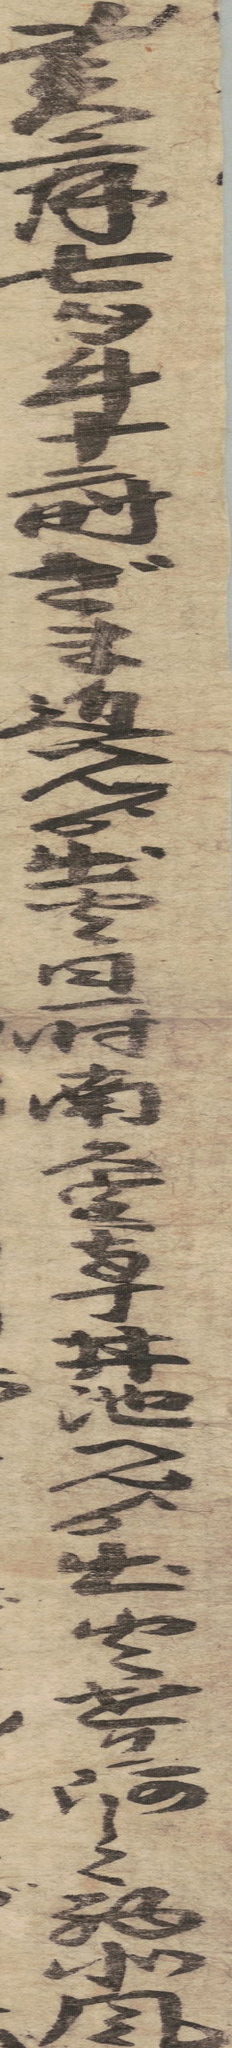亥二月七ッ計十二時ざま近へんゟ出火同一時南久宝寺町丼池へんゟ出火をりあしく西北風
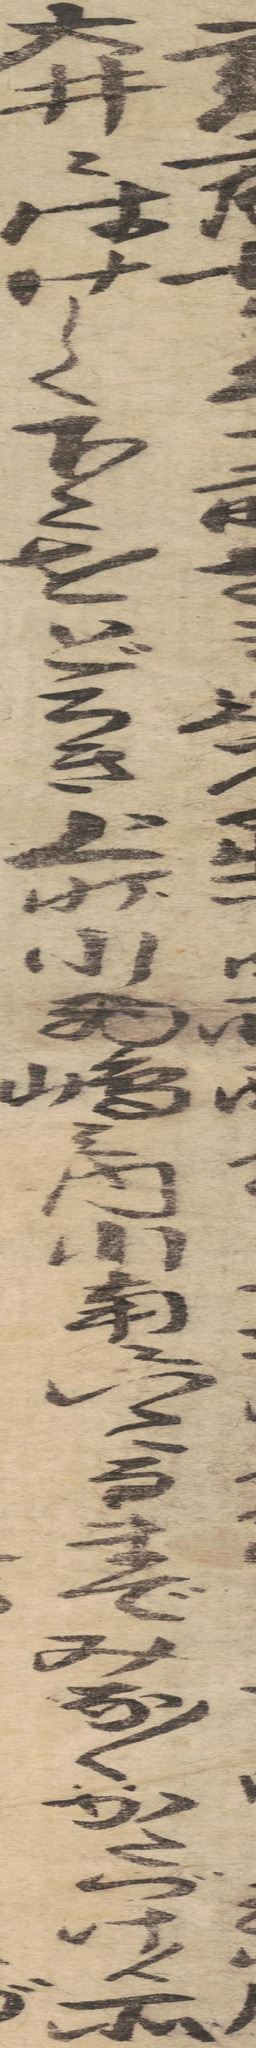大井ニはけしく下々をどろき上町北西嶋之内北南ニいたるまでみな〳〵かたづけ候所
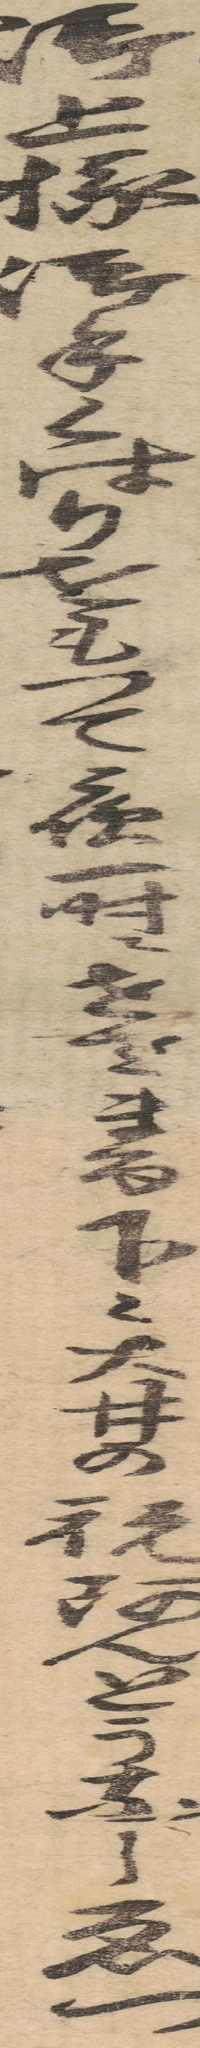御上様御手くはりをもつて夜一時ニをさまる下ゝ大井の祝あんとうなしゑづ
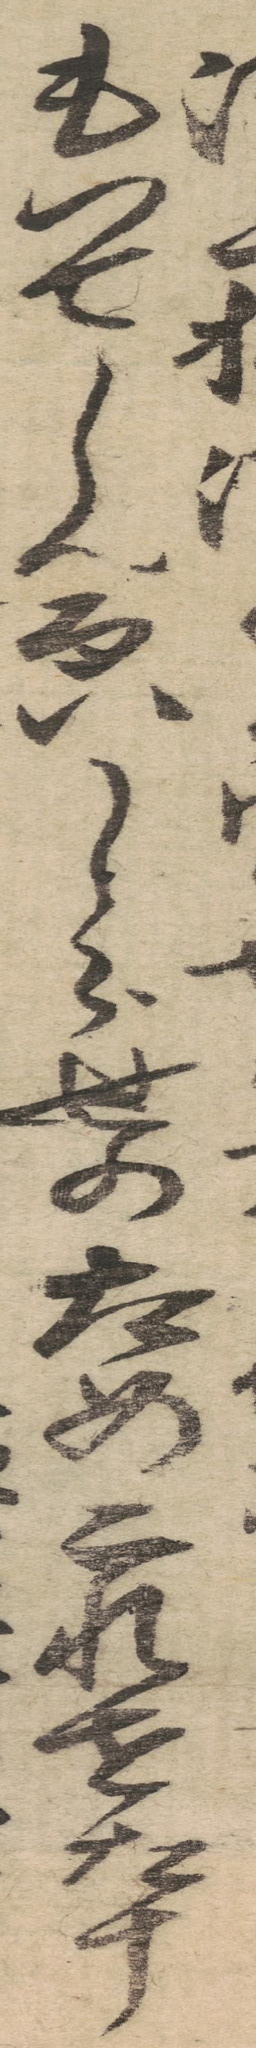もつてしんるいしらせのためこれをたす
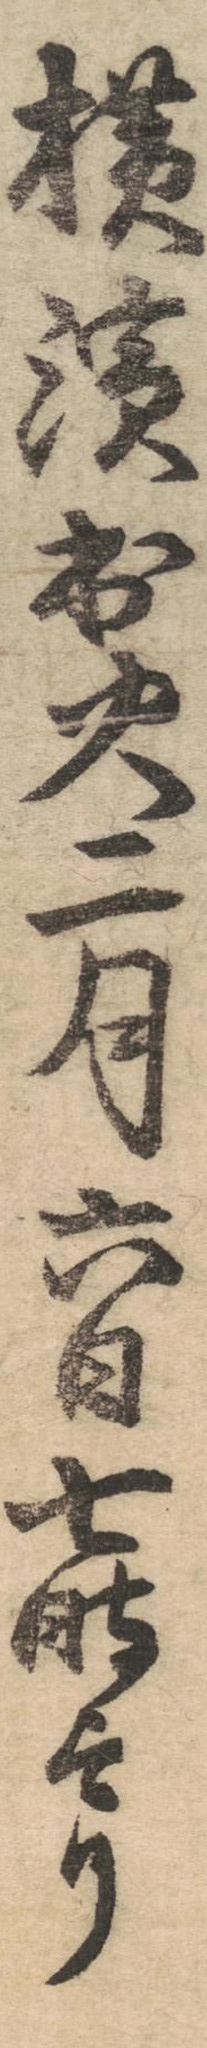横浜出火二月六日七時より
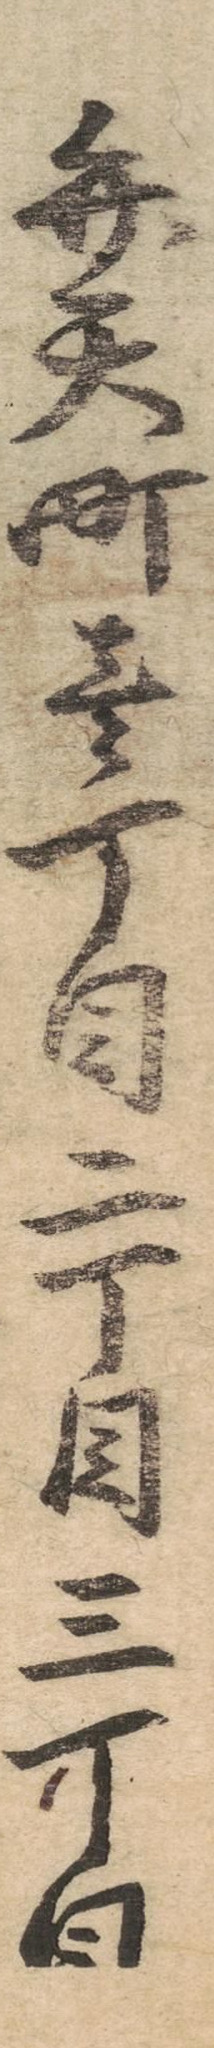弁天町壱丁目二丁目三丁目
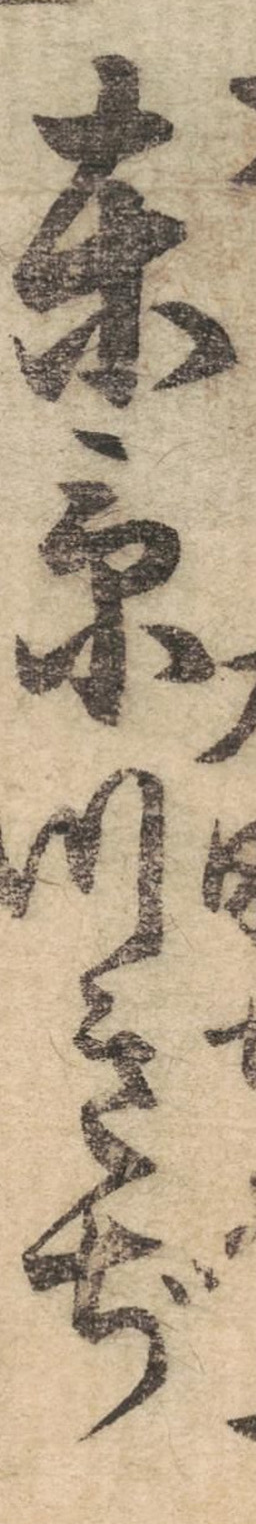東京つきぢ
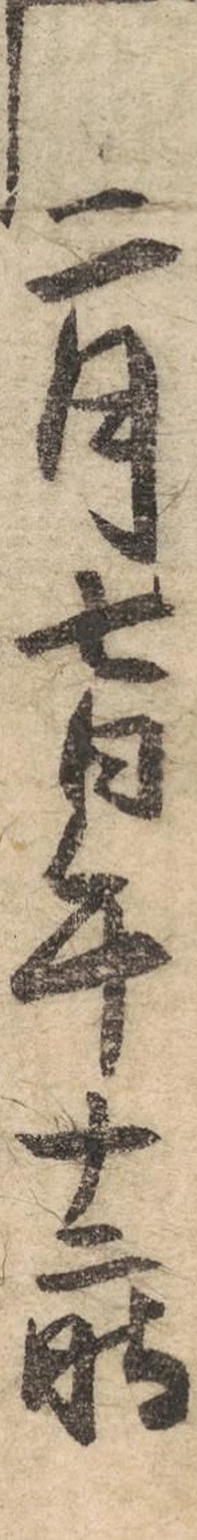二月七日午十二時
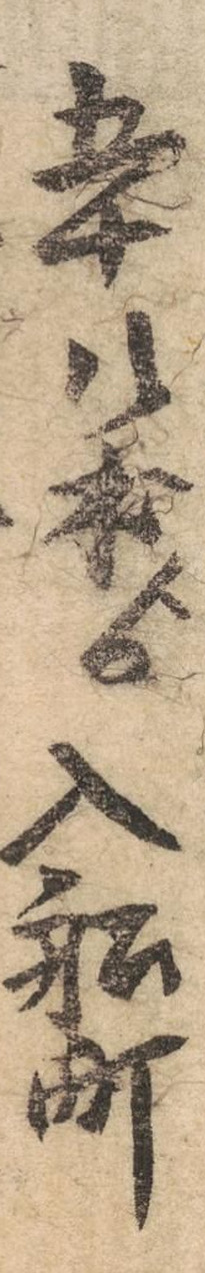五十八分？ゟ入舩町
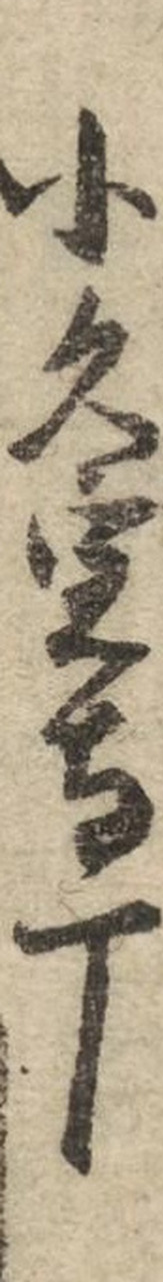北久宝寺丁
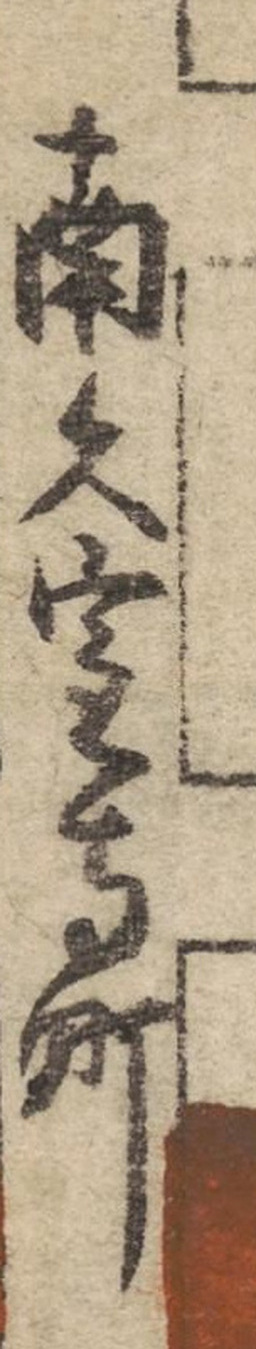北久宝寺丁
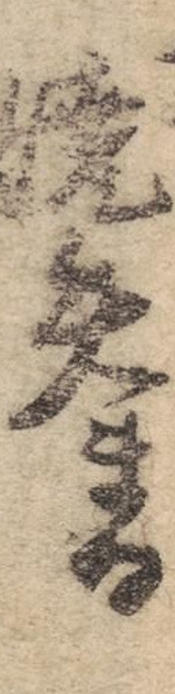焼失する
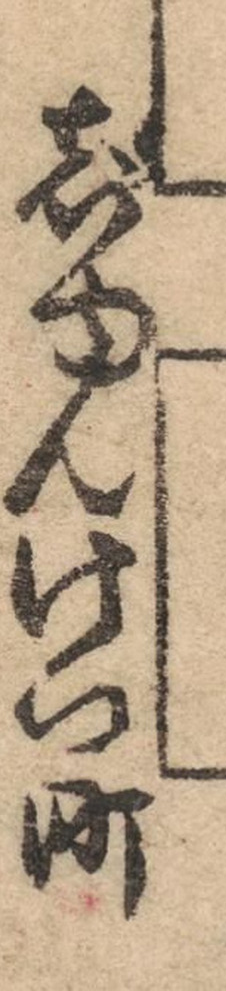じゅんけい町
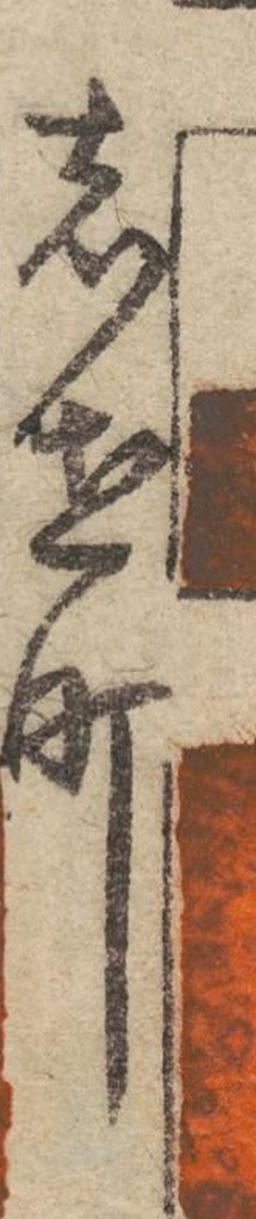しを町
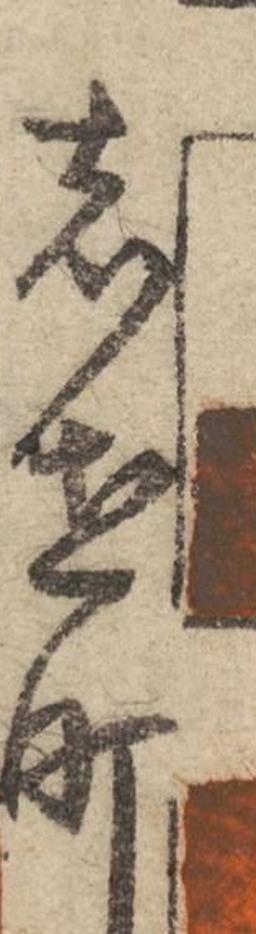しを町
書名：大坂東京横濱大火本しらべ
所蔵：東京大学地震研究所図書室 Earthquake Research Institute Library, The University of Tokyo, JAPAN
